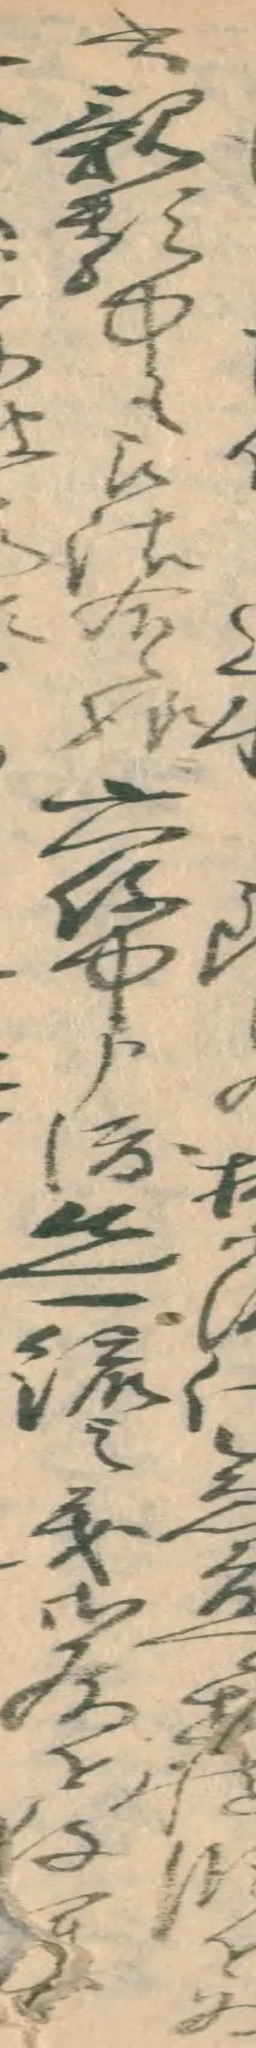書親類中も被請合候様ニ六役中申渡先一統之義御為を
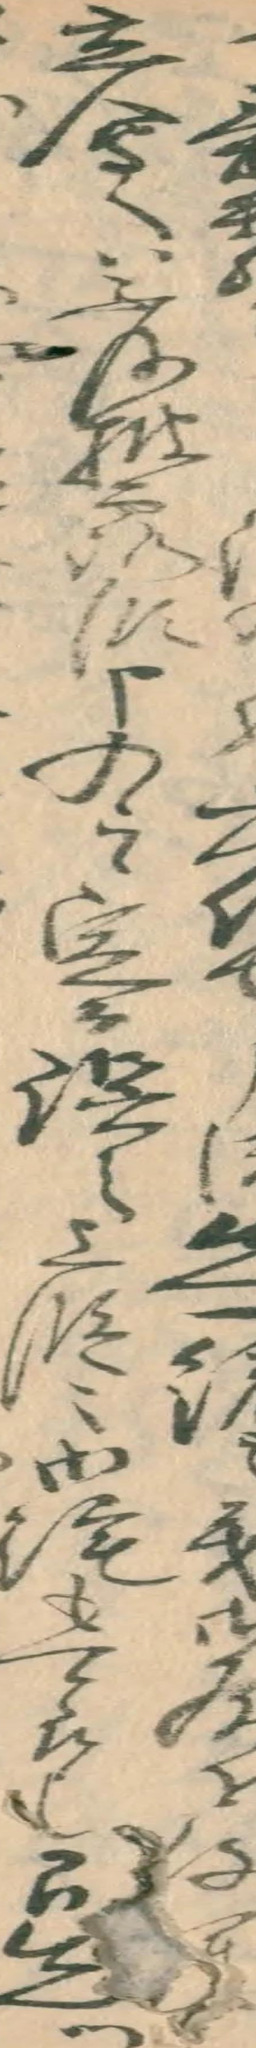立会へハ不及披露段申入候ハヽ定而誤之上段々御詫も可被申候間先ツ
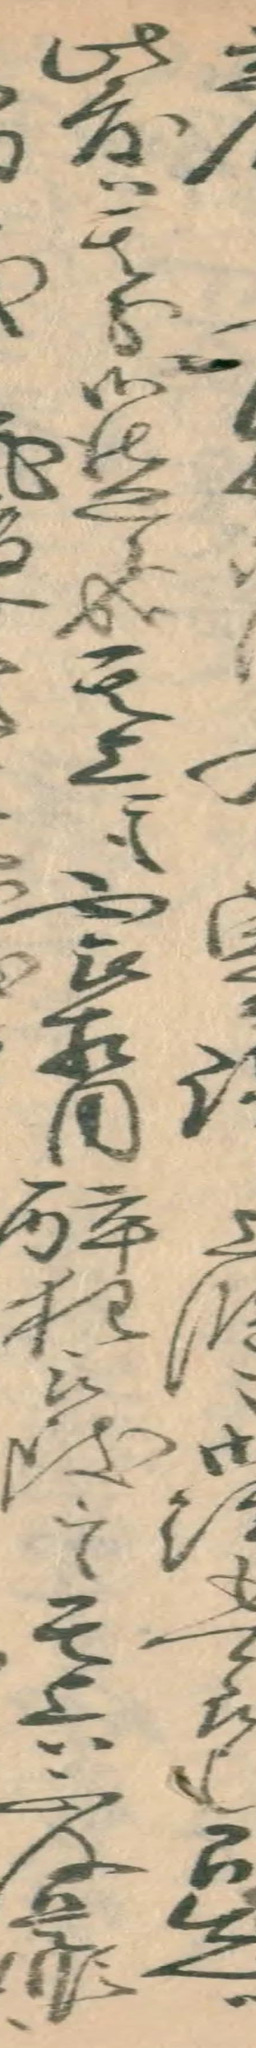此度ハ其分ニ御仕廻被成其上ニも不被相用酔狂被致候はゝ其上ハ不及是段
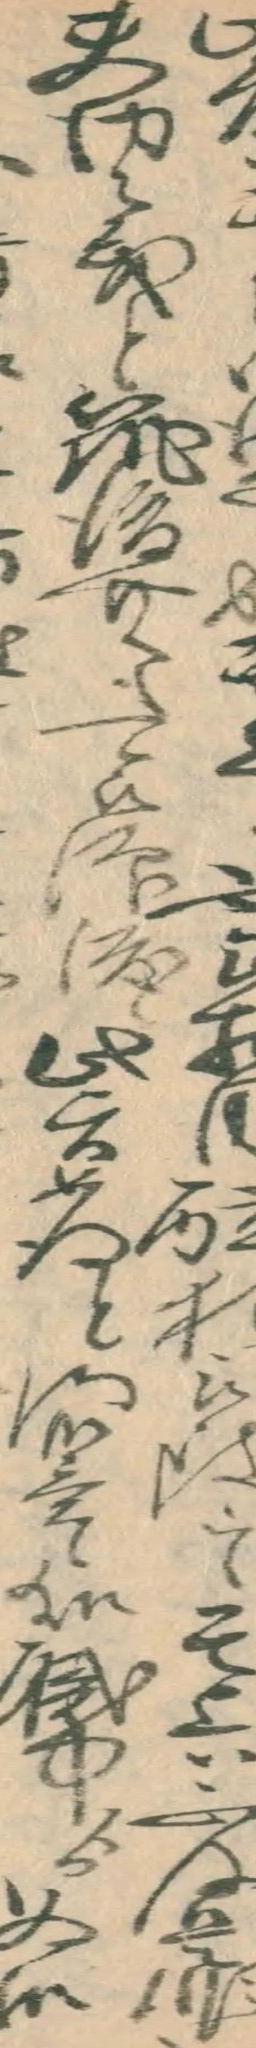夫切之義と筑後介へも可被仰渡候此旨如何と得御意候処職中ゟ為御
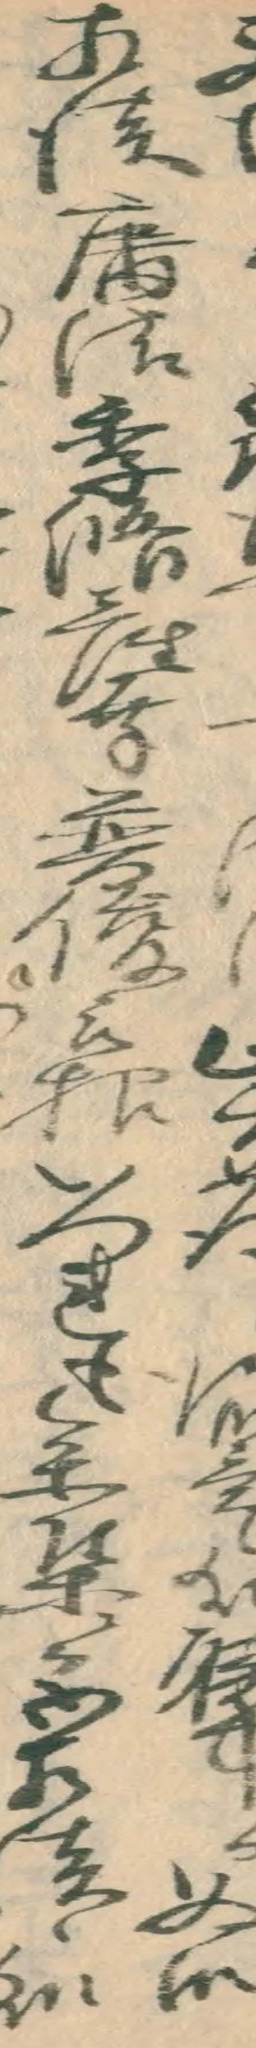相談庸清季脩産幸普俊被招いつれも参集ニ而御相談候処
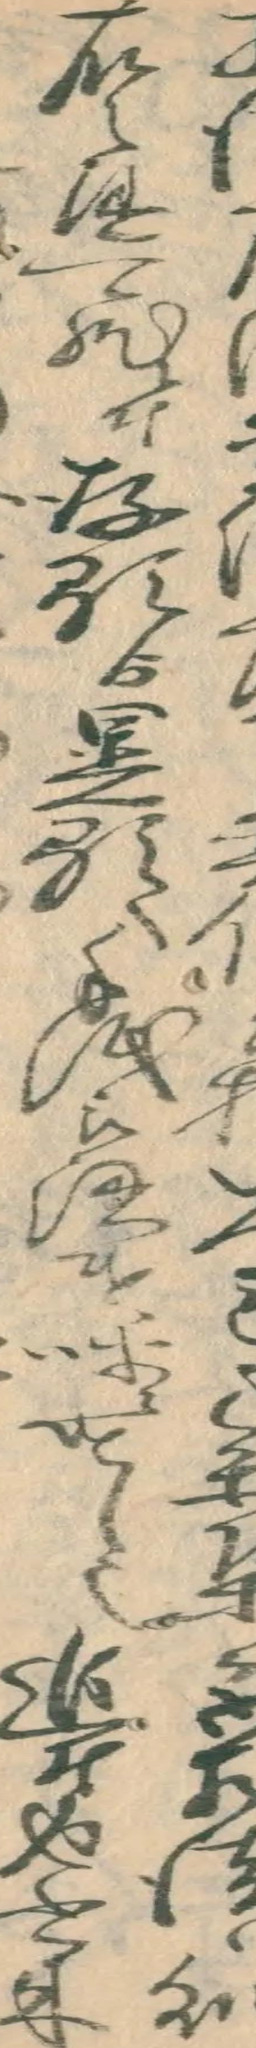右之通可然ニ付存顕ゟ晃顕へ手紙被認遣呼ニ遣候也追付返書来
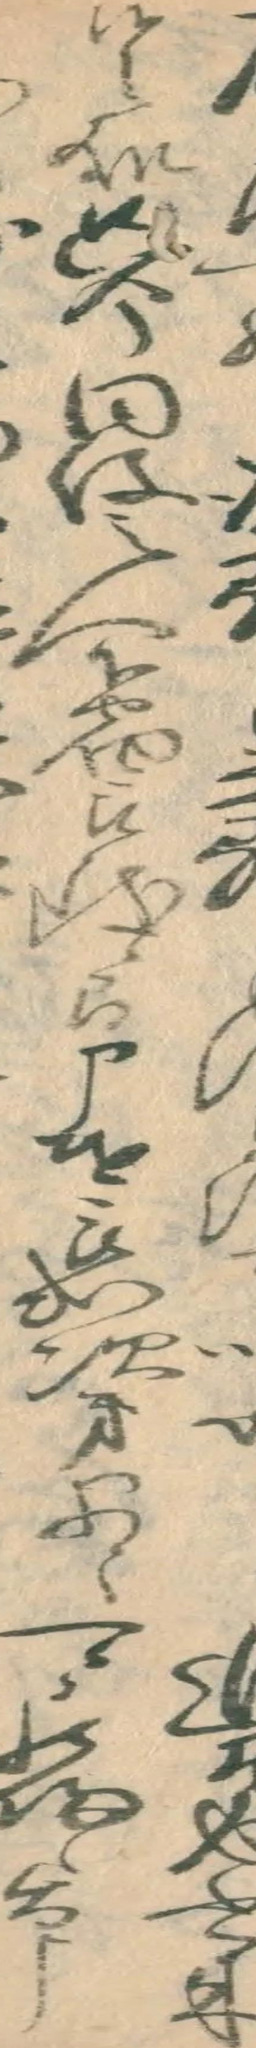候処只今同役之人下宿被致候間申遣被出次第早々可罷帰候旨申
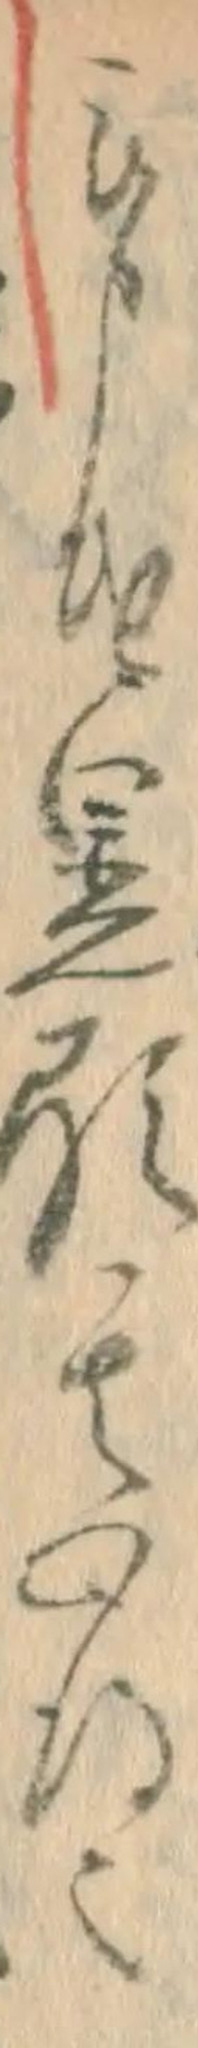被申遣晃顕其心得也
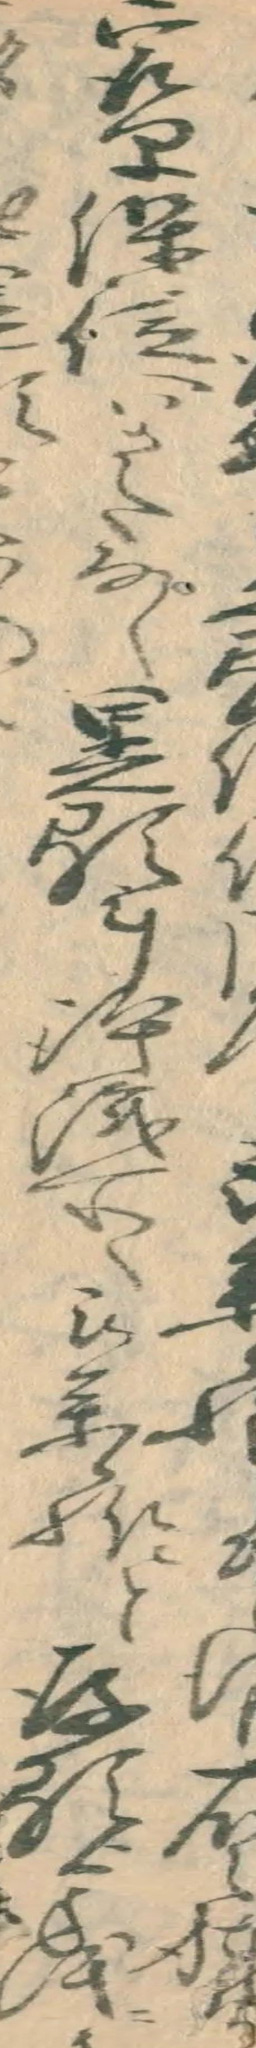最早保徒へハさたなく是顕計評議所へ被参候様ニと存顕ゟ手紙ニ而
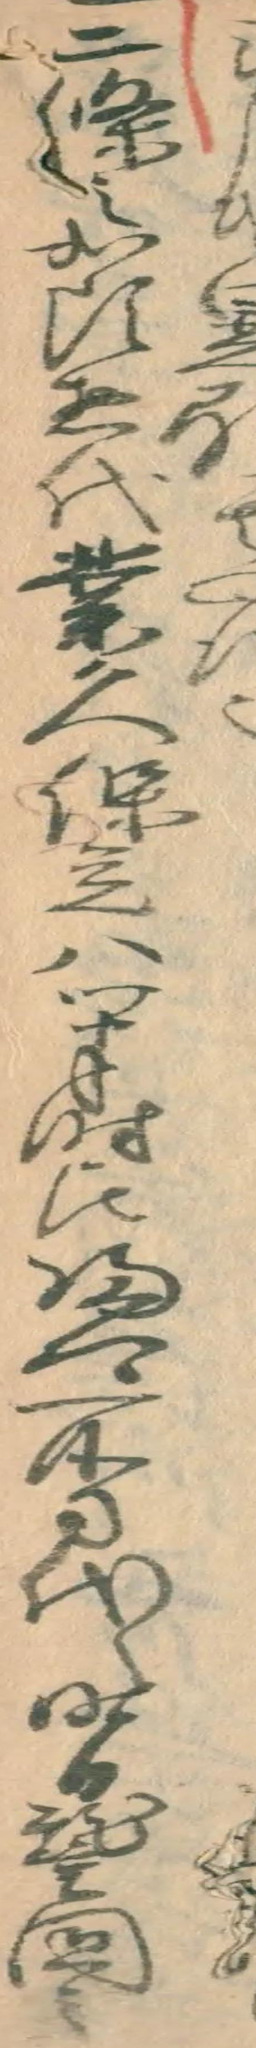一二条之出頭惣代業久保覚八ツ半時比帰郷所方代へ昨日警固之

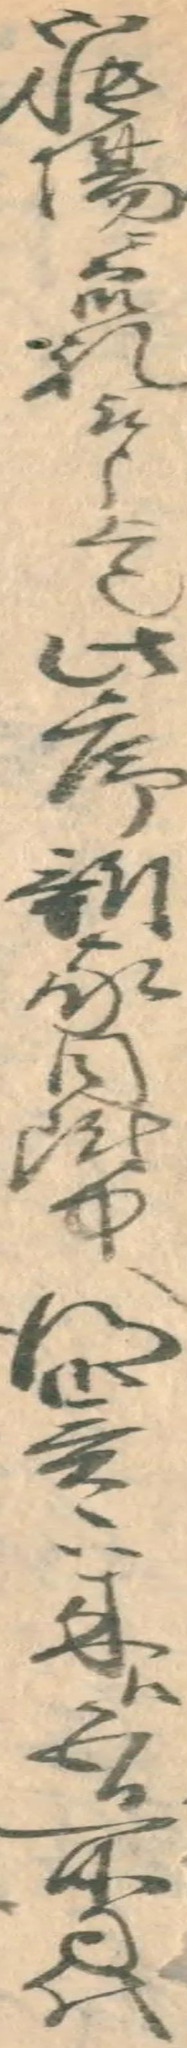御帳場ニ而御礼被申上也此序新家目附中へ得御意候ハ来ル五日所司代
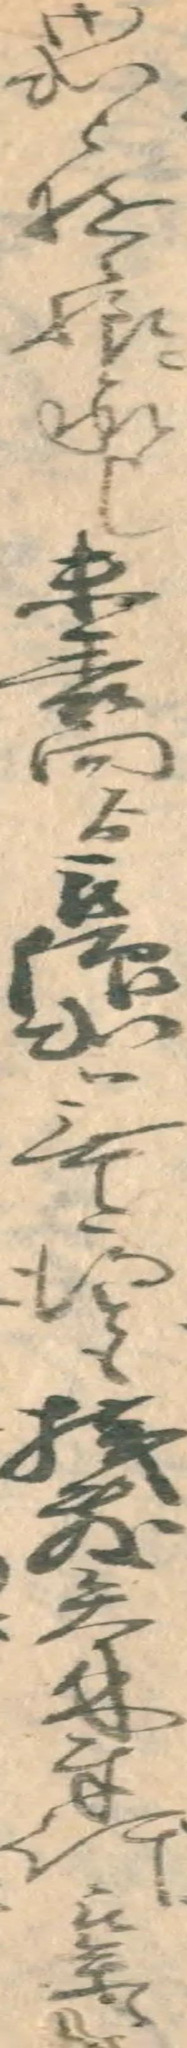御出被遊候様ニ承申候未表向ゟ被仰出ハ無之候得とも桟敷矢来奉行被参候
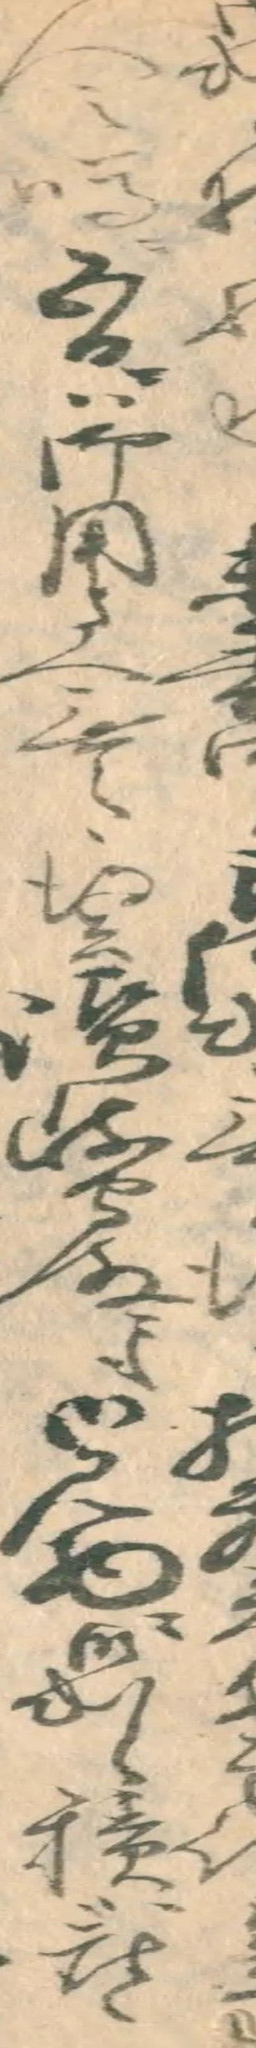人之噂ニ五日ニハ御用さへ無之候得者讃岐守殿ニも御見物ニ御出候積ニ御座候
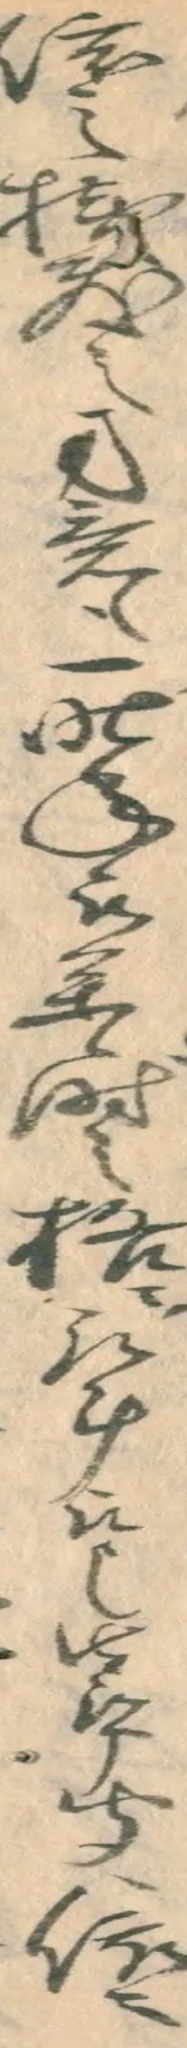依之桟敷之用意も一昨年被参候時之格ニ取計被申候由被申聞候依之
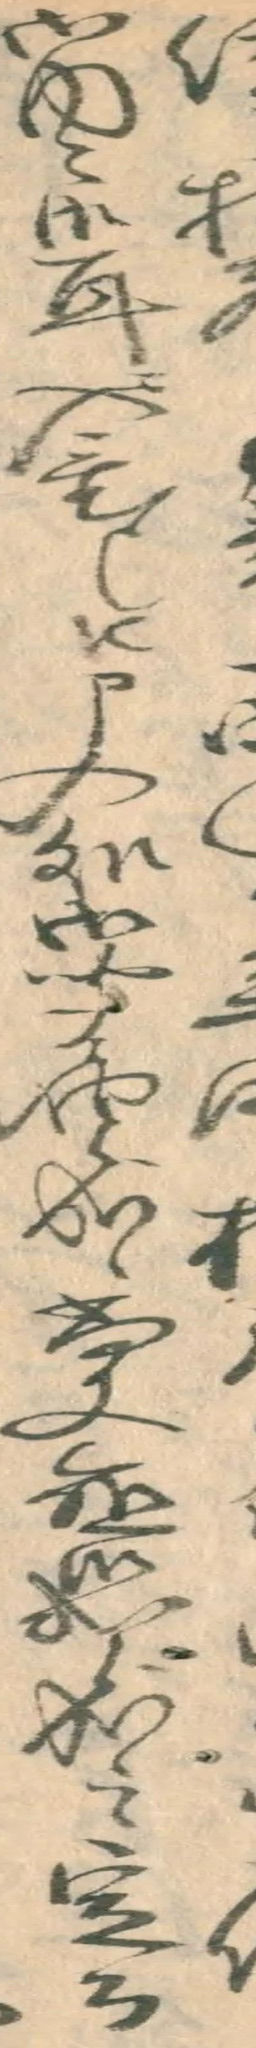御内々御耳ニ入置申候由申入処御聞届被成候尚又愈御出被成候ハヽ定而
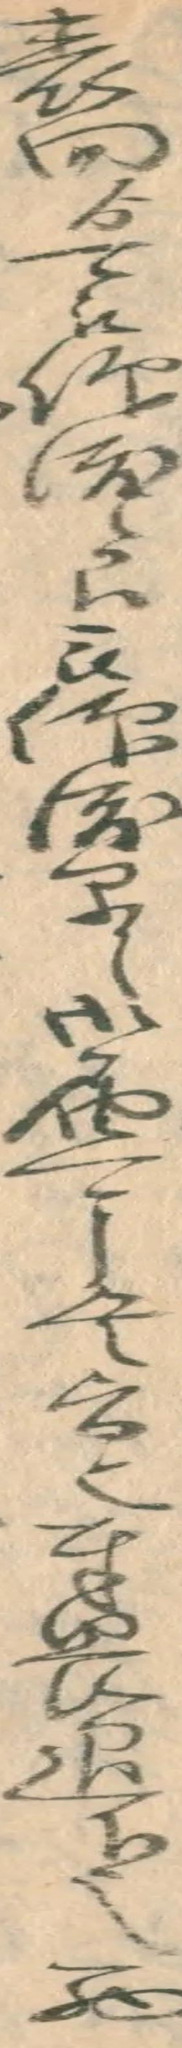表向ゟ可被仰渡候間被仰渡早々御届可申上之旨也奉畏退下也西
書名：賀茂社記録. 第58冊
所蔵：国立国会図書館 National Diet Library, JAPAN
